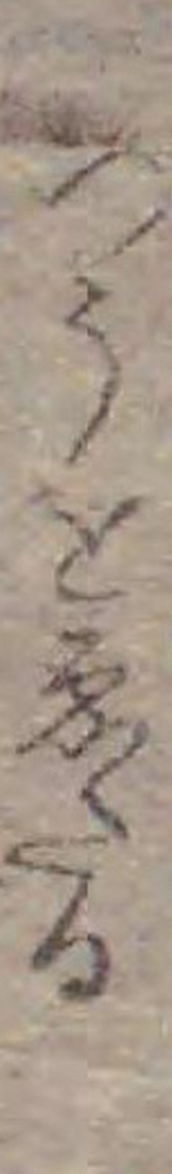つうをゑたる
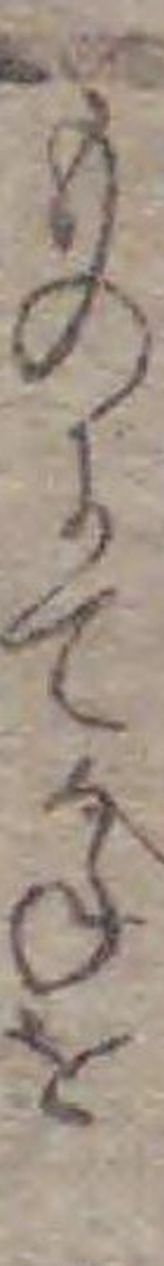ものにてかねを
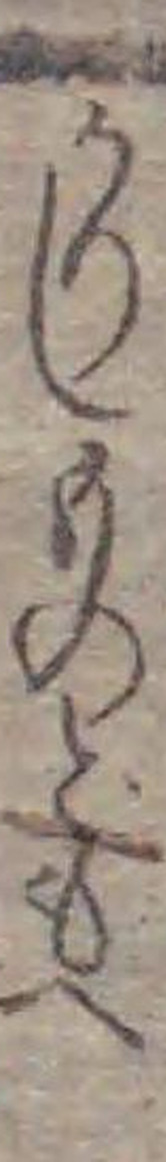かりしものどもへ
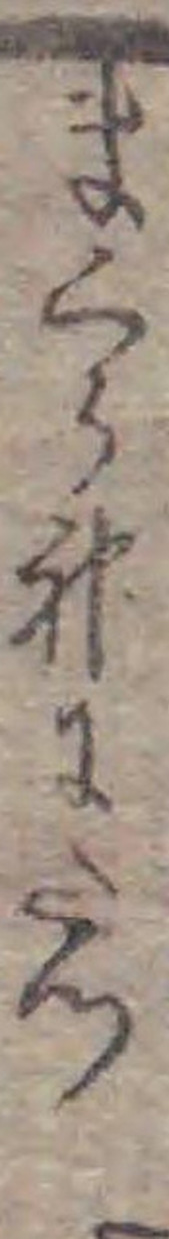まくら神にたつ
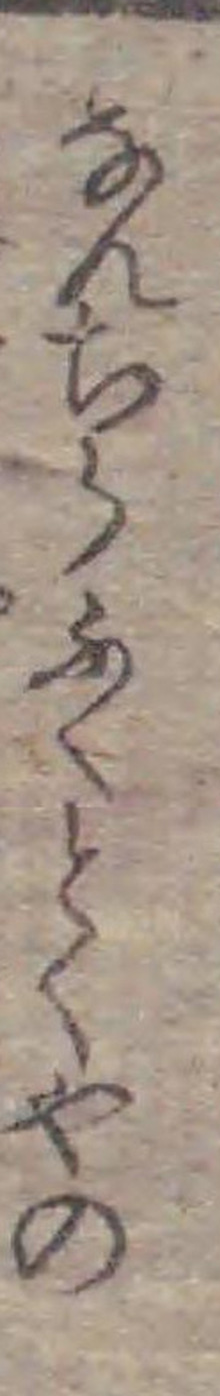なんちらふくとくやの
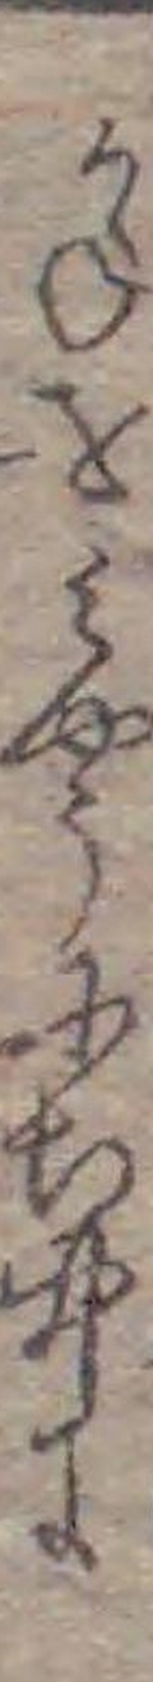かねをみやうにち中に
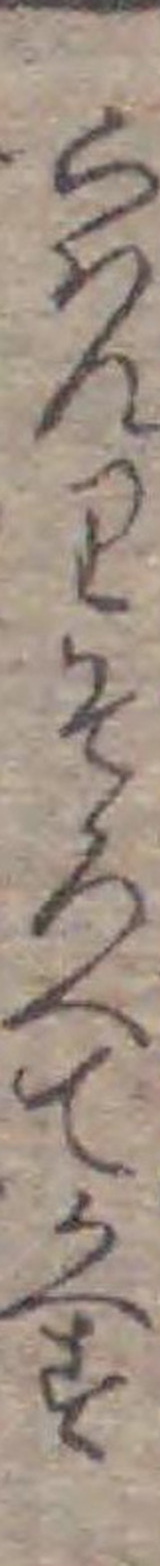くはんりそろへてかへす
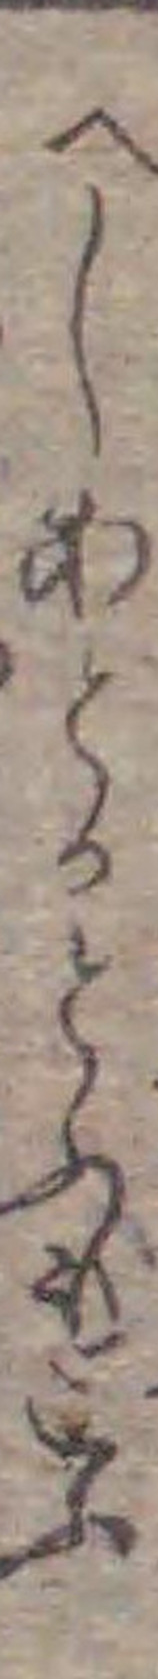へしあとかとふもこふ
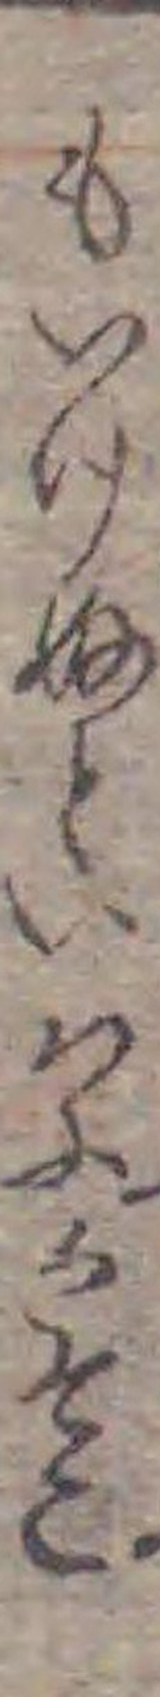もいけぬといはふかそこ
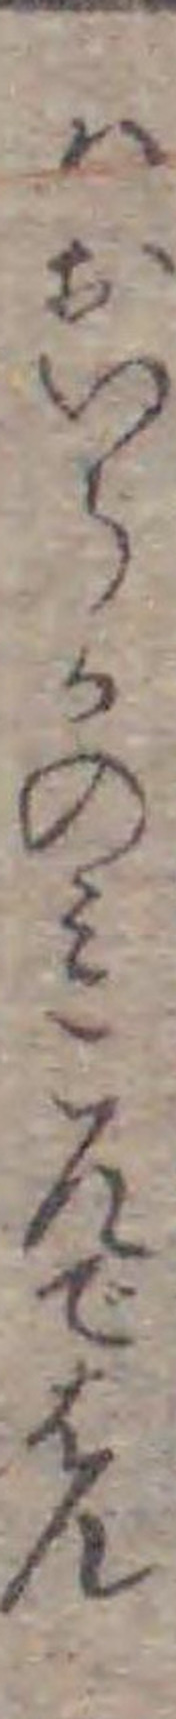はおいらかのみこんではん
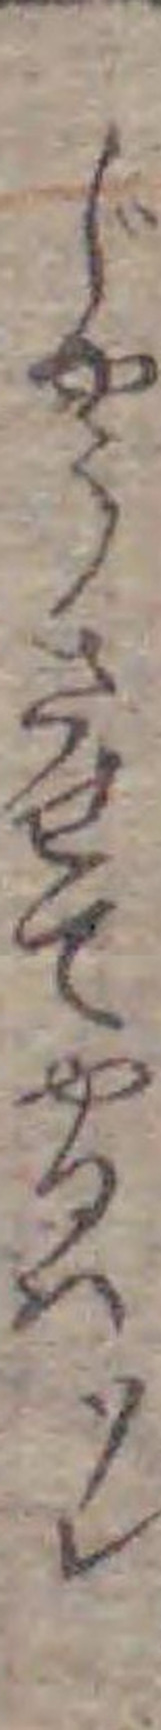じやうさせてやるはソレ
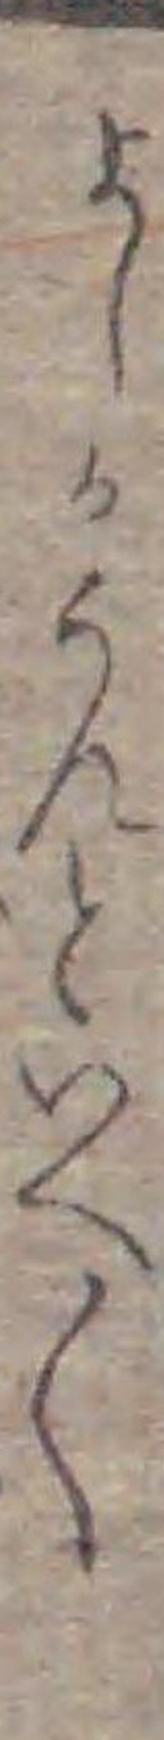よしかうんといへ〳〵
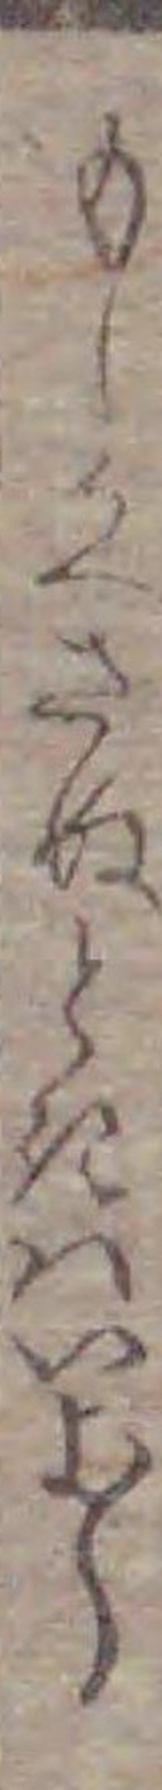もしかへさぬときはいよ〳〵
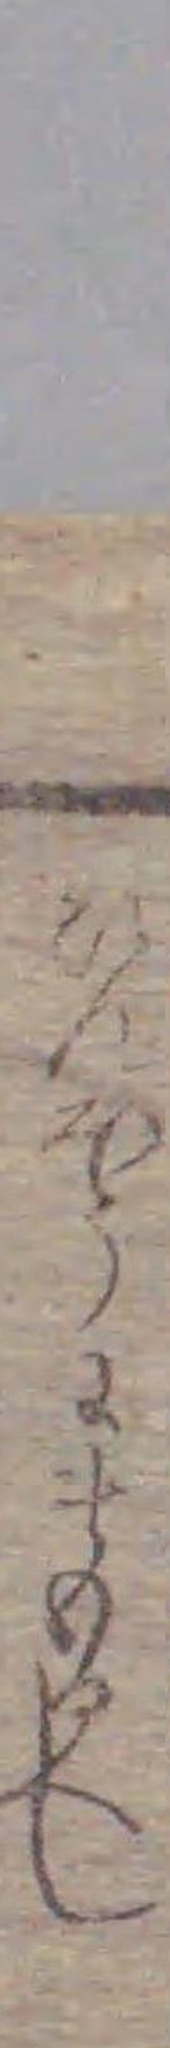びんほうにまもるへし

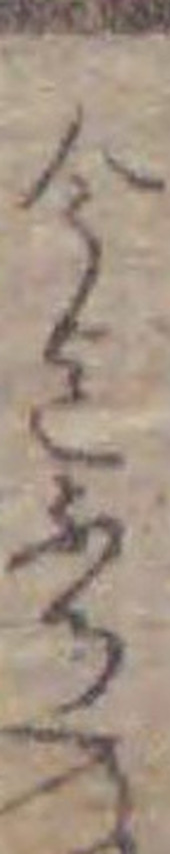今迄ふつ
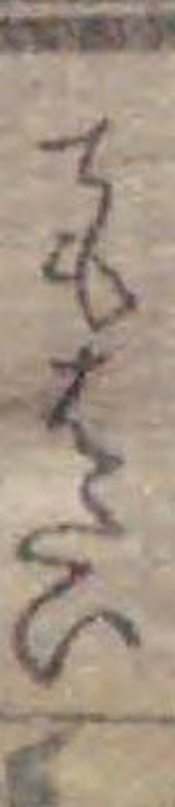てもはたい
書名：紺屋百物語 : 3巻
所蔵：国立国会図書館 National Diet Library, JAPAN
